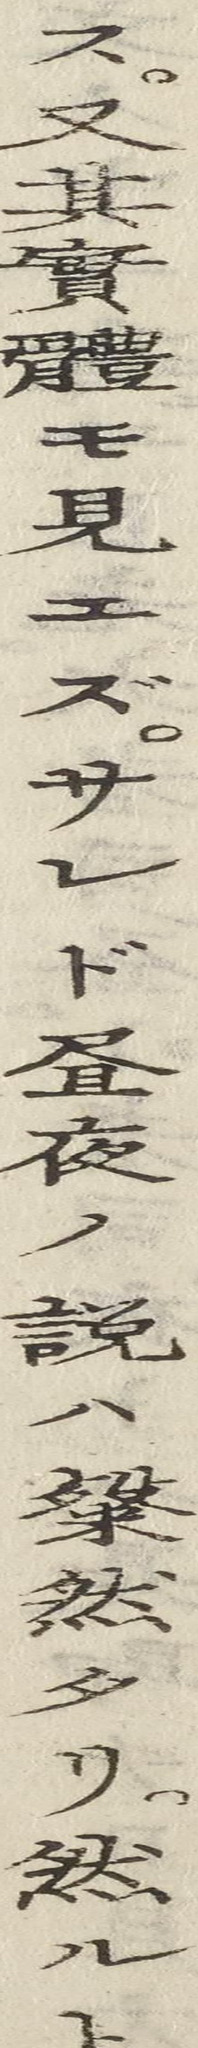ス。又其実体モ見エズ。サレド昼夜ノ説ハ粲然タリ。然ルト
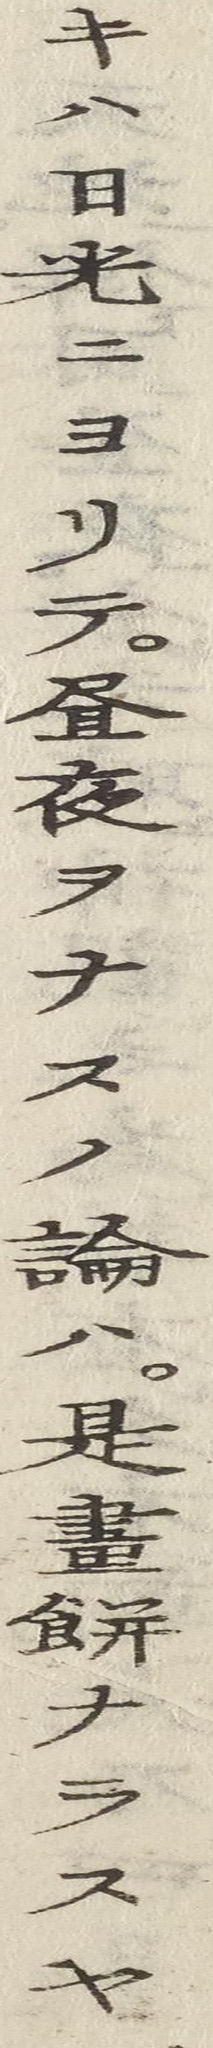キハ日光ニヨリテ。昼夜ヲナスノ論ハ。是画餅ナラスヤ是二
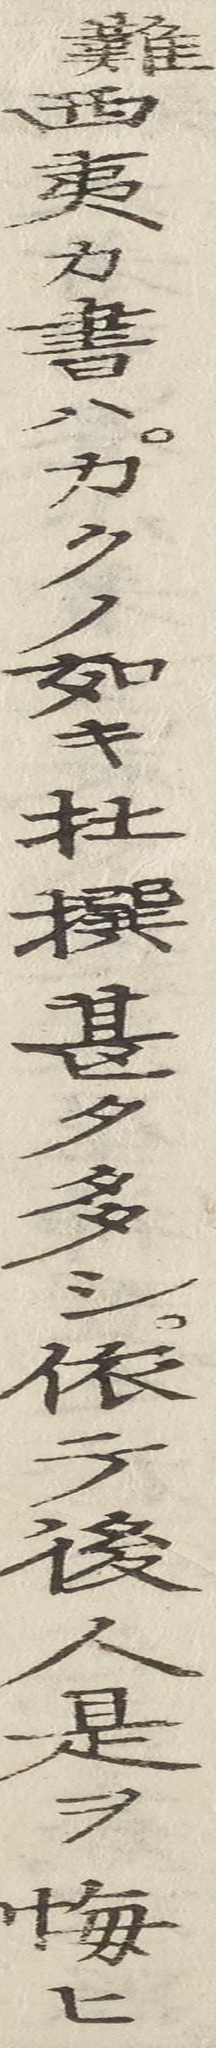難西夷カ書ハ。カクノ如キ杜撰甚タ多シ。依テ後人是ヲ悔ヒ
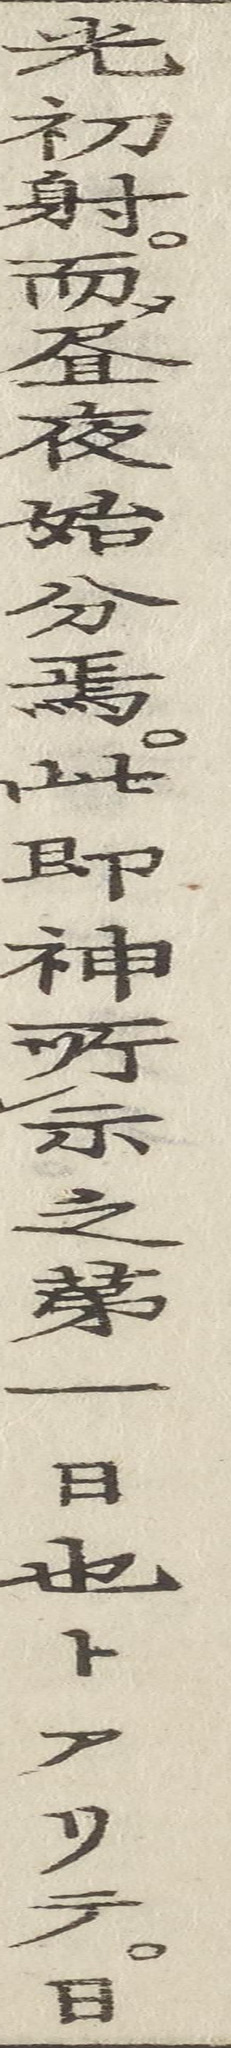光初射。而昼夜始分焉。此即神所示之第一日也トアリテ。日
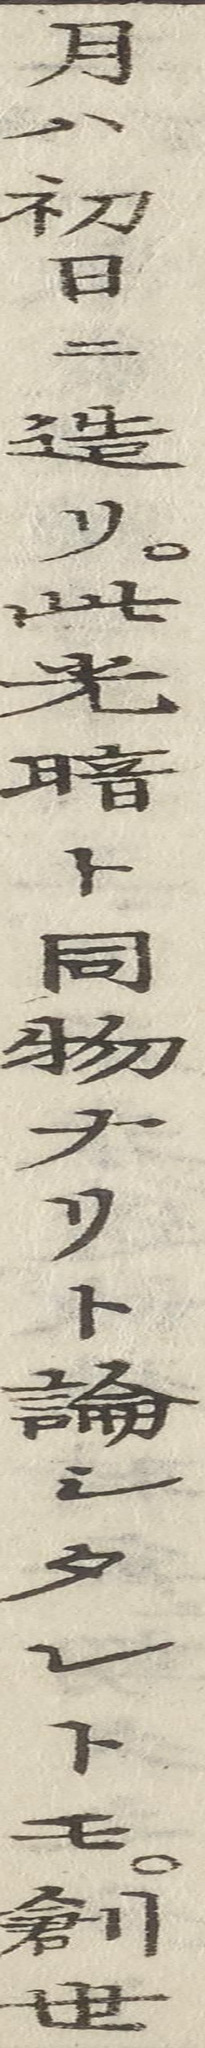月ハ初日ニ造リ。此光暗ト同物ナリト論シタレトモ。創世
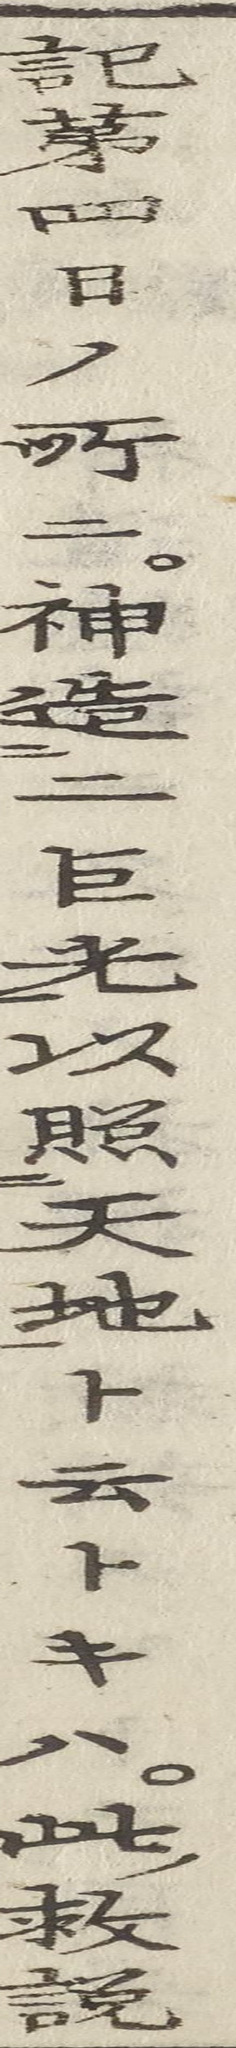記第四日ノ所ニ。神造ニニ巨光以照ニ天地ト云トキハ。此救説
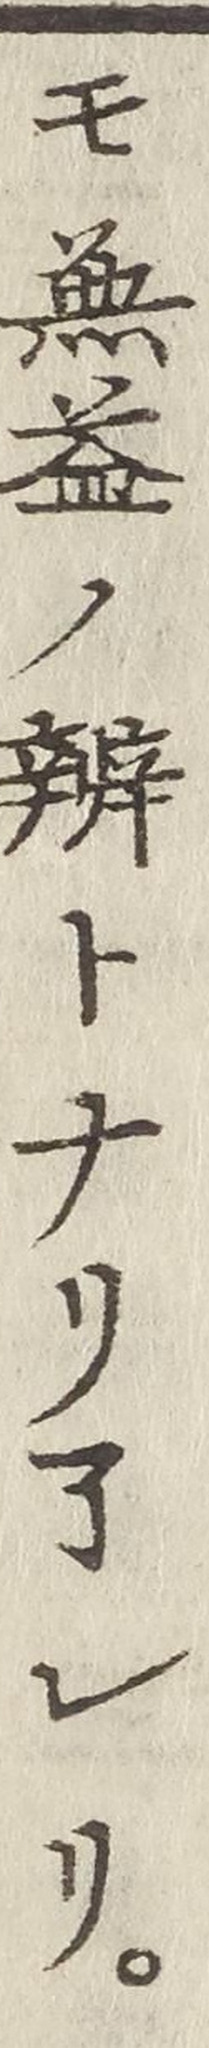モ無益ノ弁トナリ了レリ。

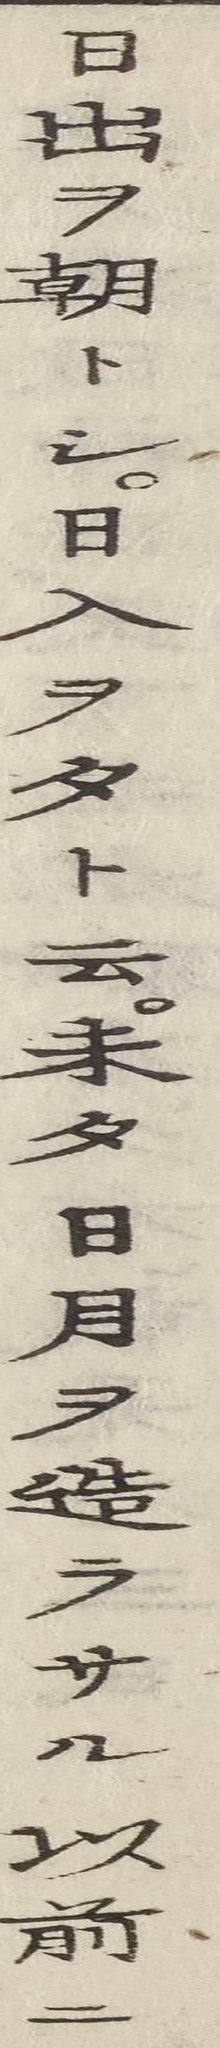日出ヲ朝トシ。日入ヲ夕ト云。未タ日月ヲ作ラサル以前ニ
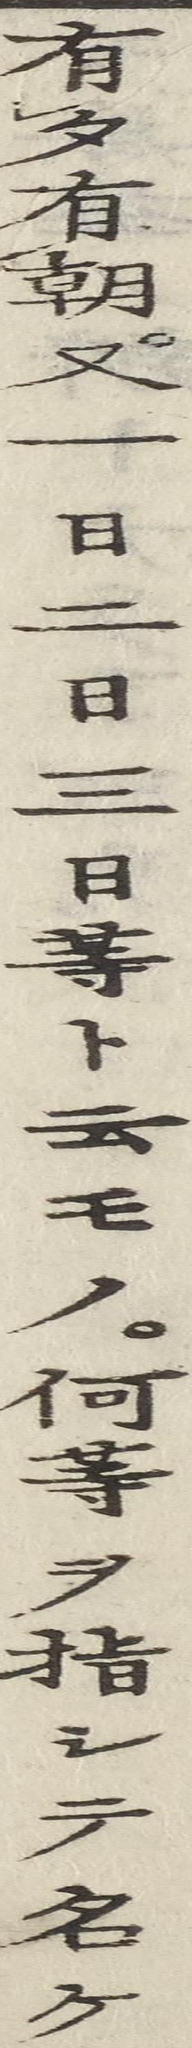有夕有朝。又一日二日三日等ト云モノ。何等ヲ指シテ名ケ
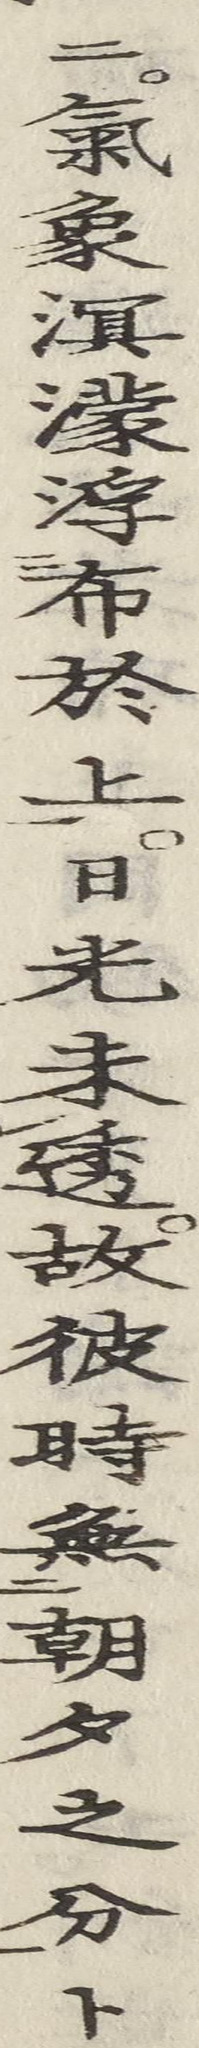三六丁ニ。気象溟濛浮ニ布於上。日光未透。故彼時無ニ朝夕之分ト
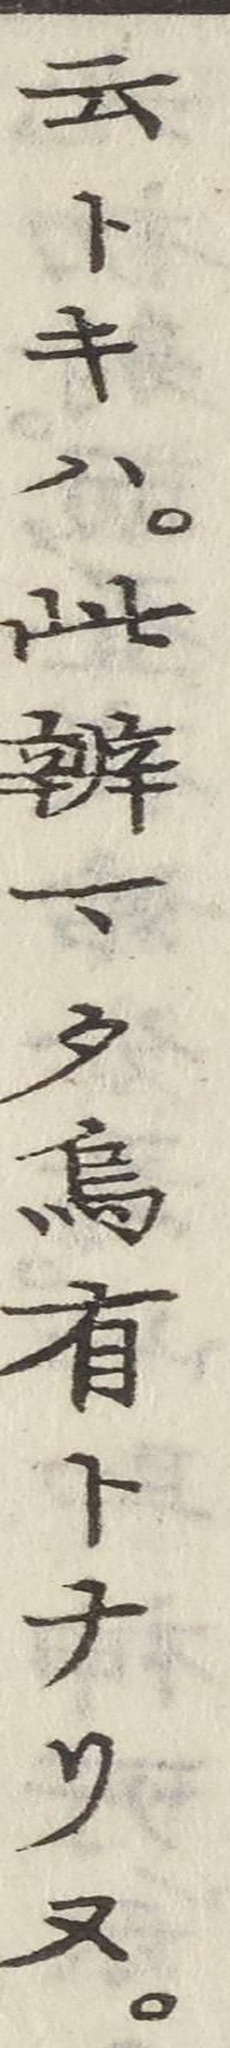云トキハ。此弁マタ烏有トナリヌ。
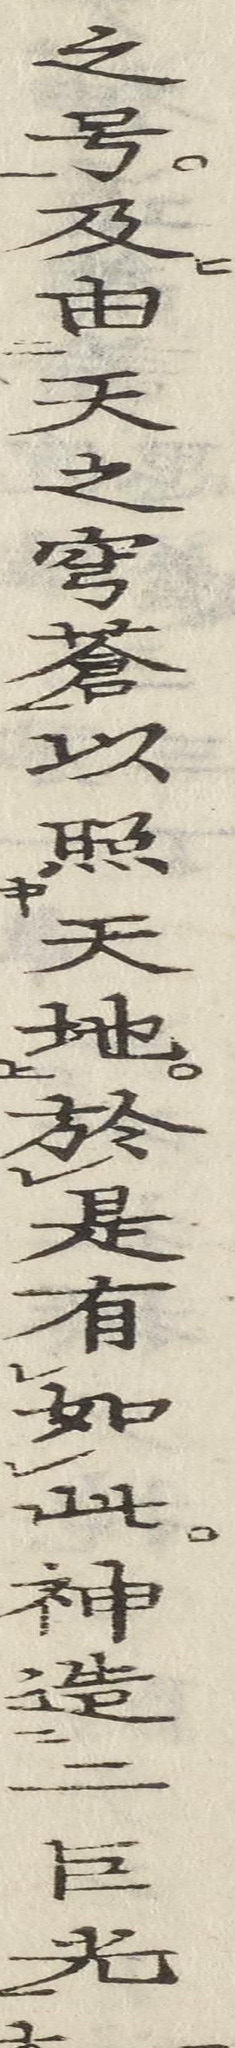之号。及由ニ天之穹蒼以照天地。於是有如此。神造ニニ巨光一本
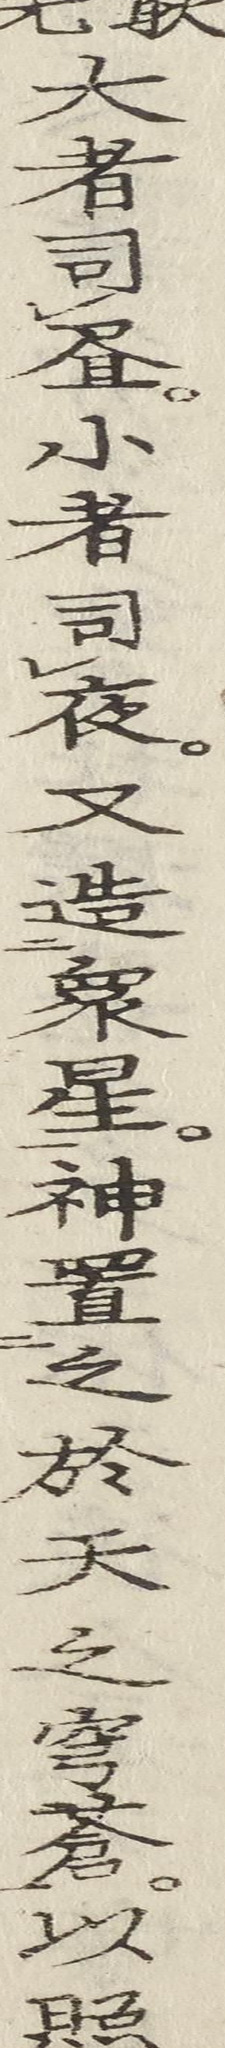耿光大者司昼。小者司夜。又造ニ衆星。神置ニ之於天之穹蒼。以照ニ
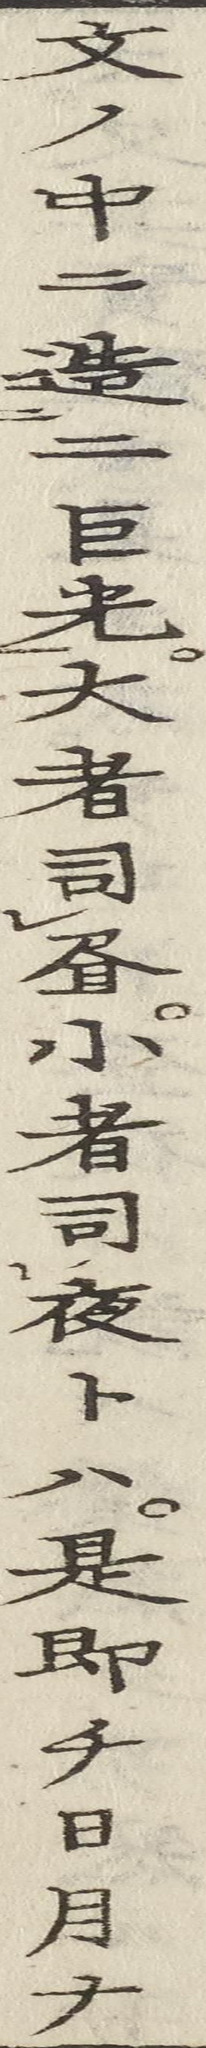文ノ中ニ造ニニ巨光。大者司昼。小者司夜トハ。是即チ日月ナ
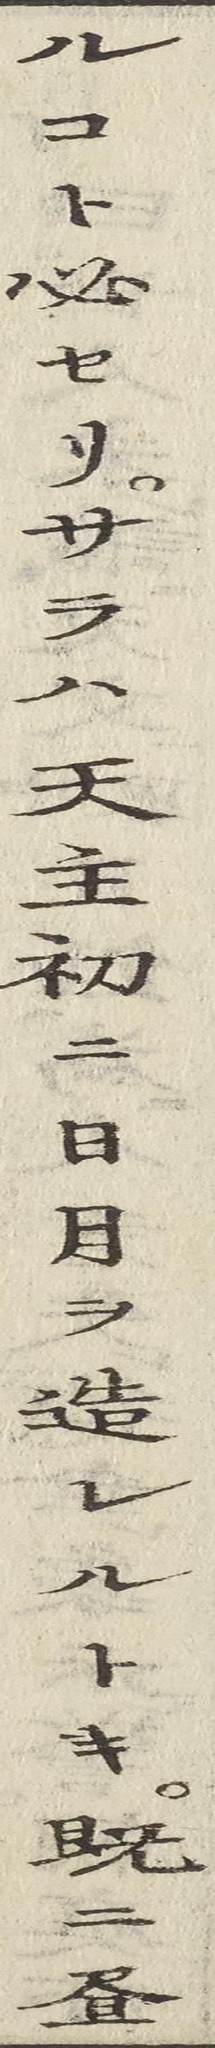ルコト必セリ。サラハ天主初ニ日月ヲ造レルトキ。既ニ昼
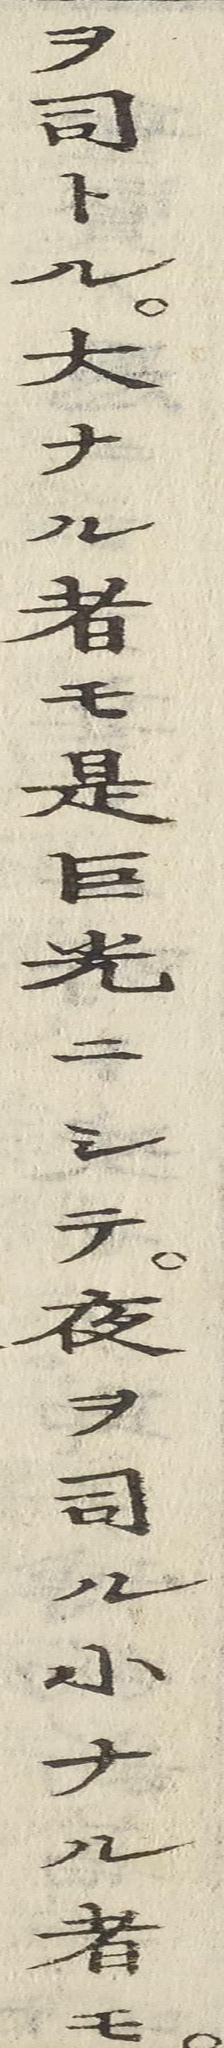ヲ司トル。大ナル者モ是巨光ニシテ。夜ヲ司ル小ナル者モ。
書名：護法新論　二編　下
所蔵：東京大学地震研究所図書室 Earthquake Research Institute Library, The University of Tokyo, JAPAN
